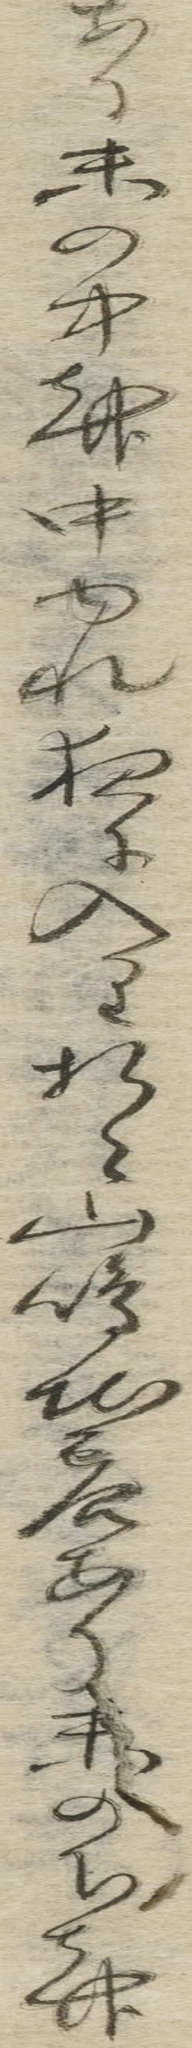あり未の中刻中ゆれ夜に入り折々山鳴地震あり未の下刻
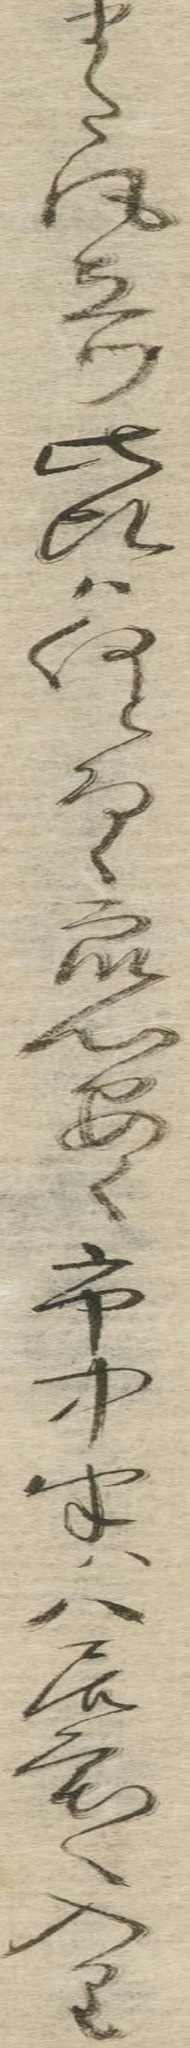また風立ッ此頃ハ何となく衆心安く市中半ハハ居宅へ入り
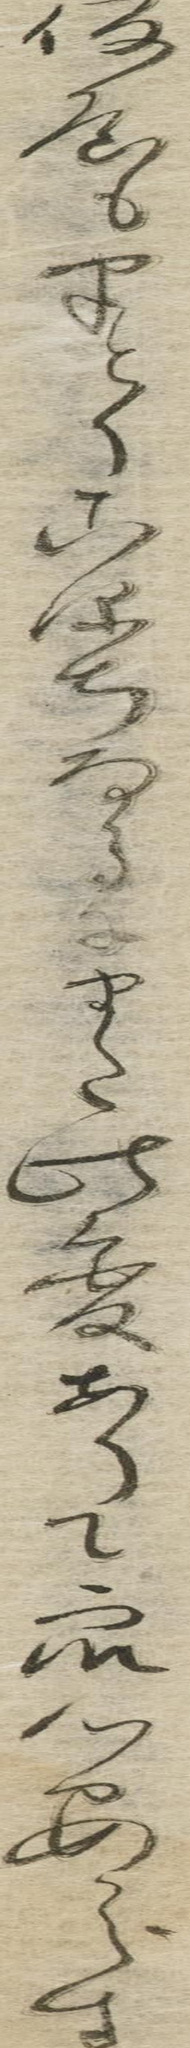仮屋も半とりこほちなるにまた此変ありて衆心安からす
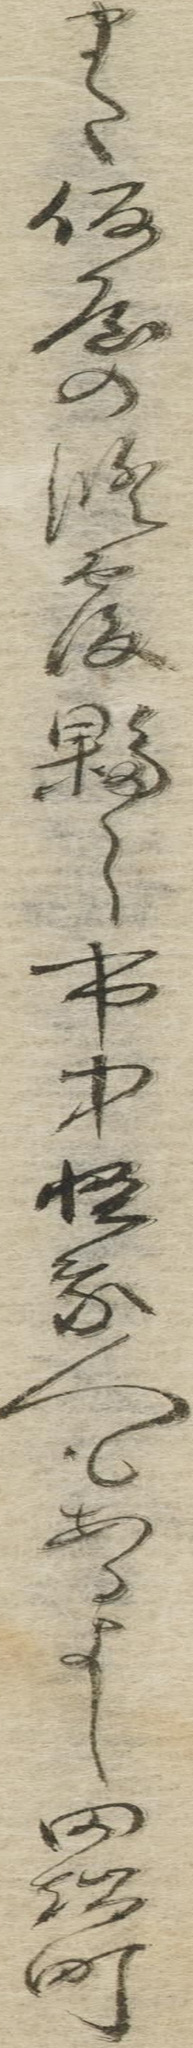また仮屋の修覆夥し市中怪我人もあるよし田端町
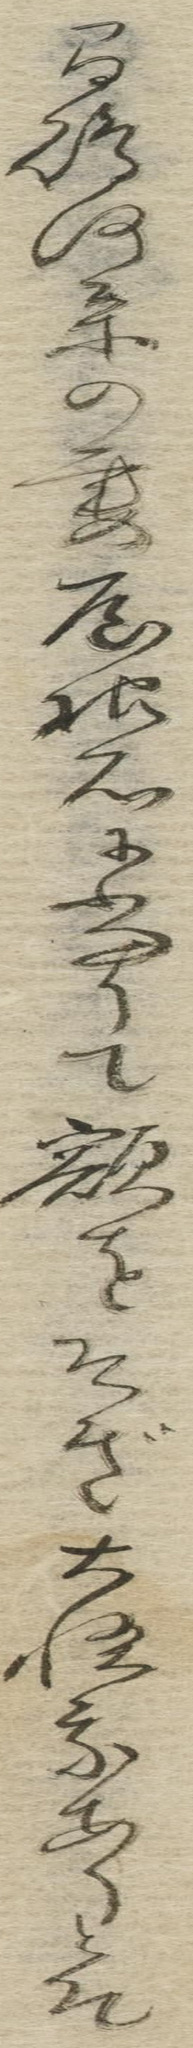間嶋何某の妻屋根石に当りて額をそぎ大怪我ありとそ

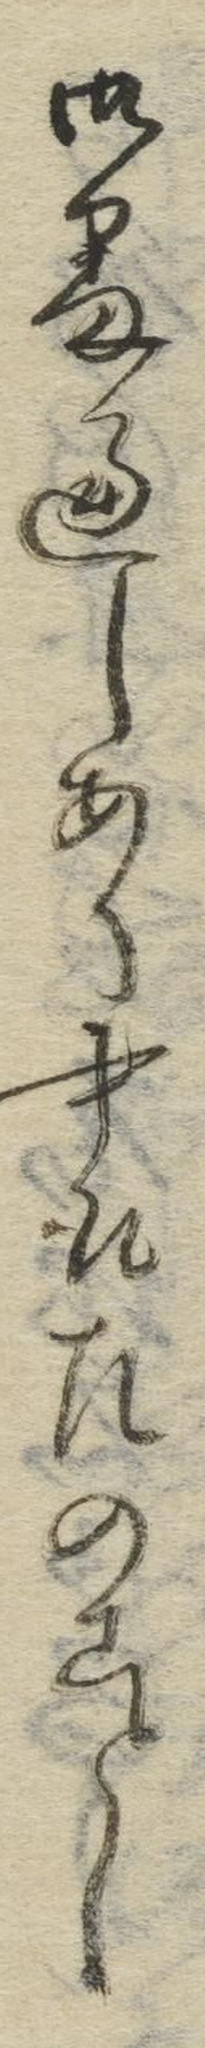御番通しあり事記左のことし
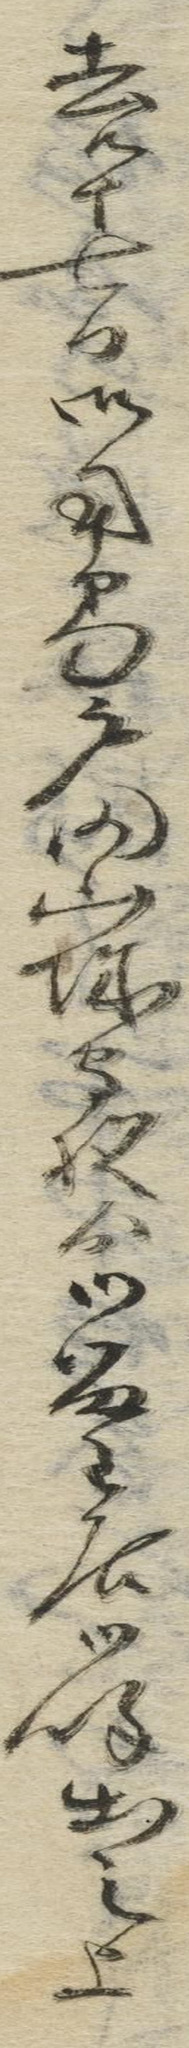去ㇽ十七日御用番戸田山城守様ゟ御留守居御呼出之上
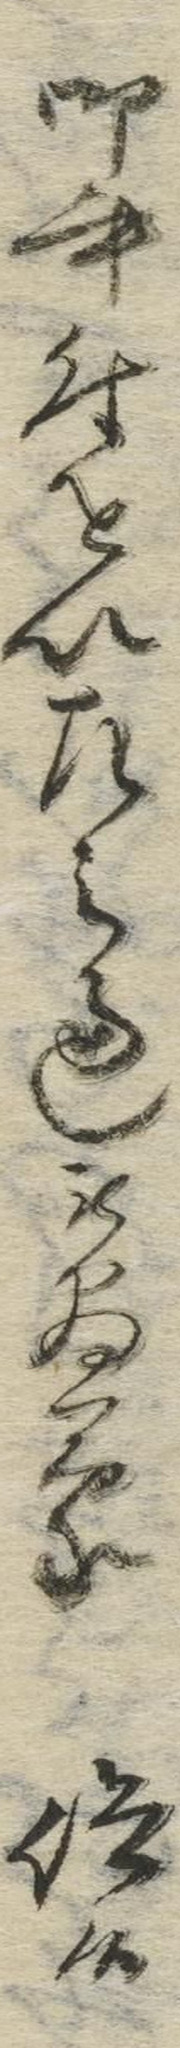御書付を以左之通被為蒙仰候
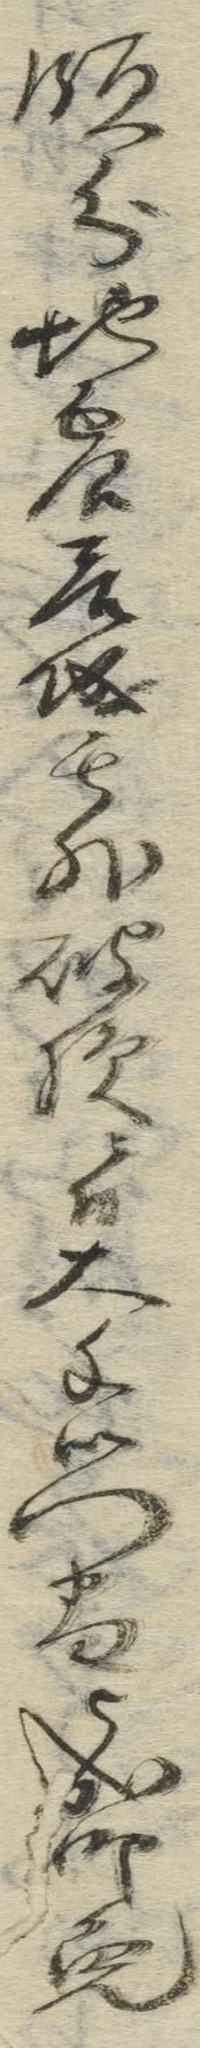領分地震居城其外破損二付大手御門番被成御免
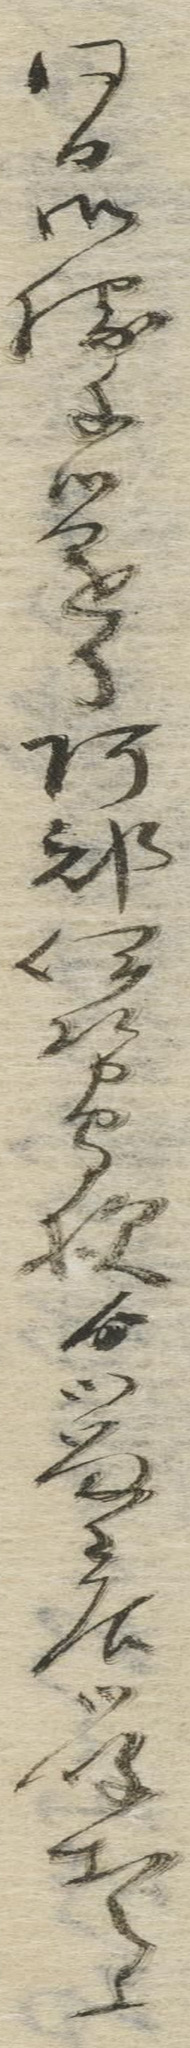同日御勝手御懸り阿部伊賀守様ゟ御留守居御呼出之上
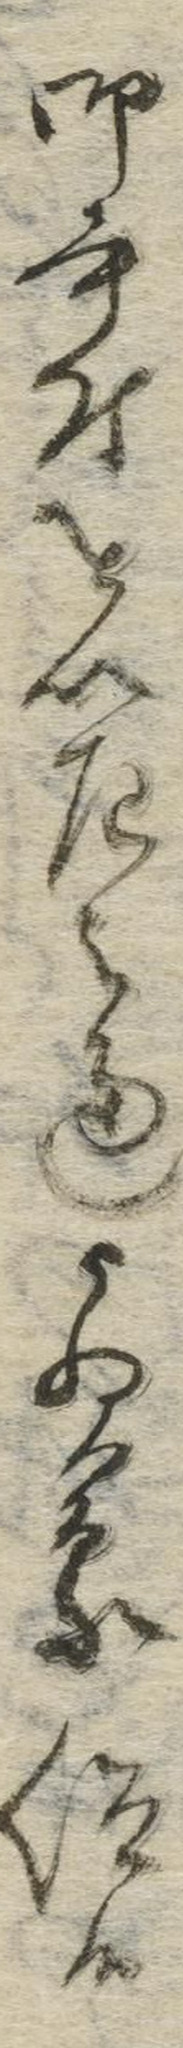御書付を以左之通被為蒙仰候
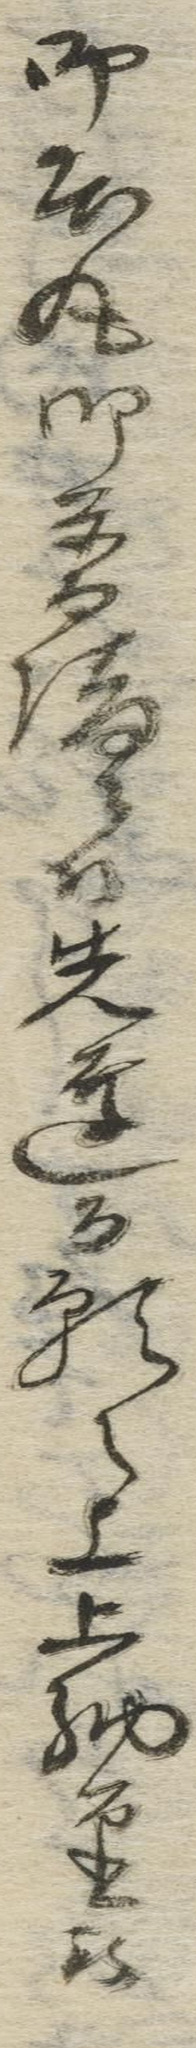御本丸御普請二付先達而願之上上納金被
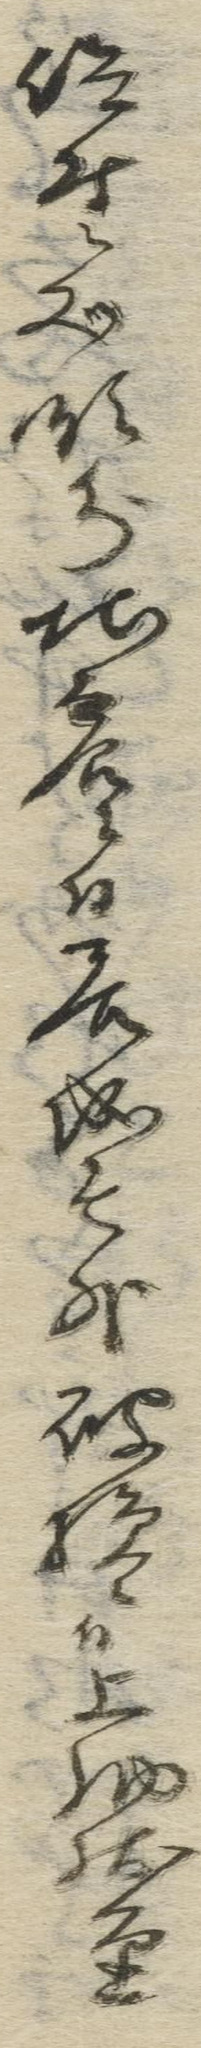仰付候処領分地震二付居城其外破損二付上納致金
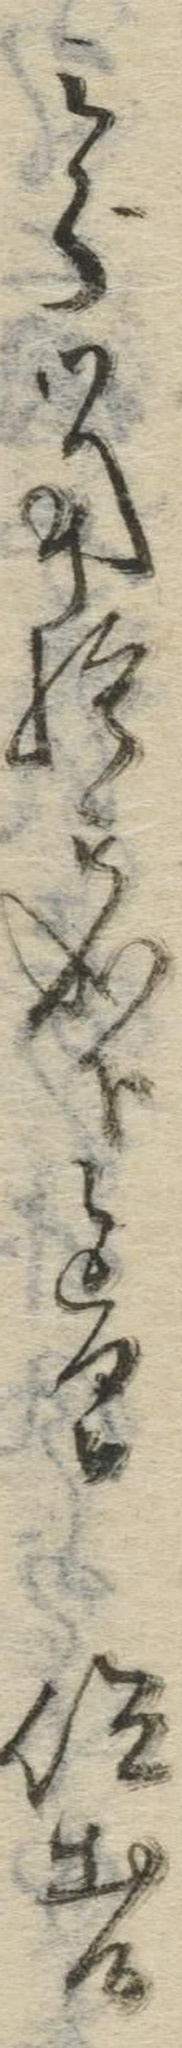之分御用捨被成下之置被仰出候
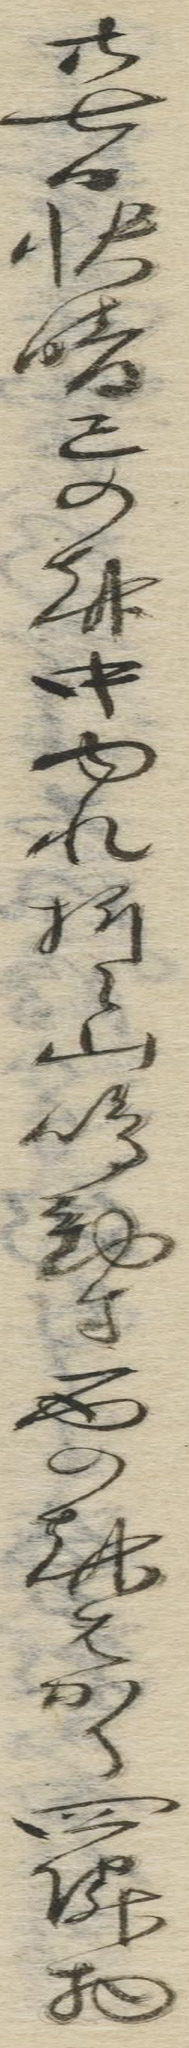廿七日快晴巳の刻中ゆれ折々山鳴動す酉の刻はかり四隣物
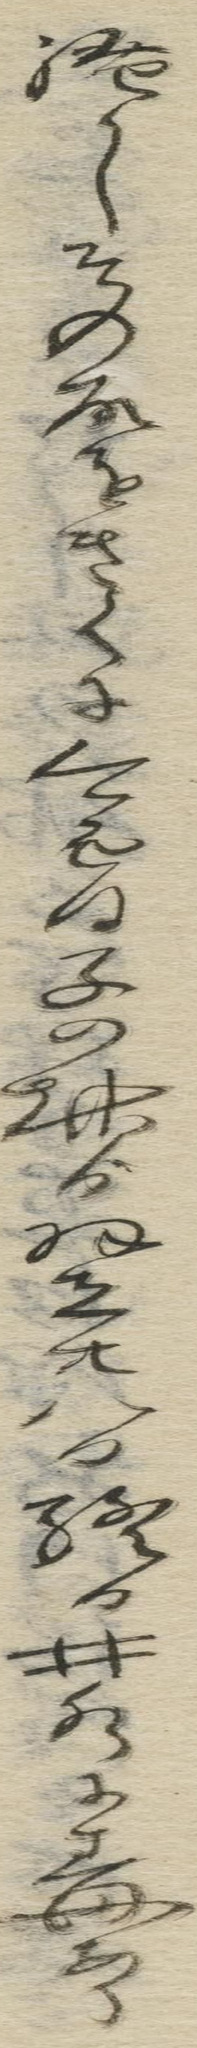騒しその故をきくに今宵子の刻ゟ翌廿八日終日井水に毒あり
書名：弘化丁未天變日記
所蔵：東京大学地震研究所図書室 Earthquake Research Institute Library, The University of Tokyo, JAPAN
